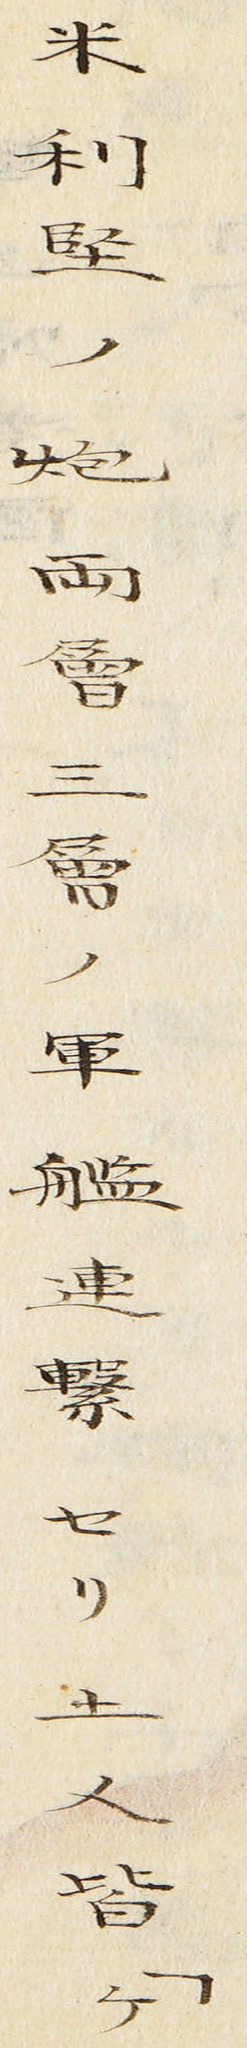米利堅ノ炮両層三層ノ軍艦連繋セリ土人皆「ケ
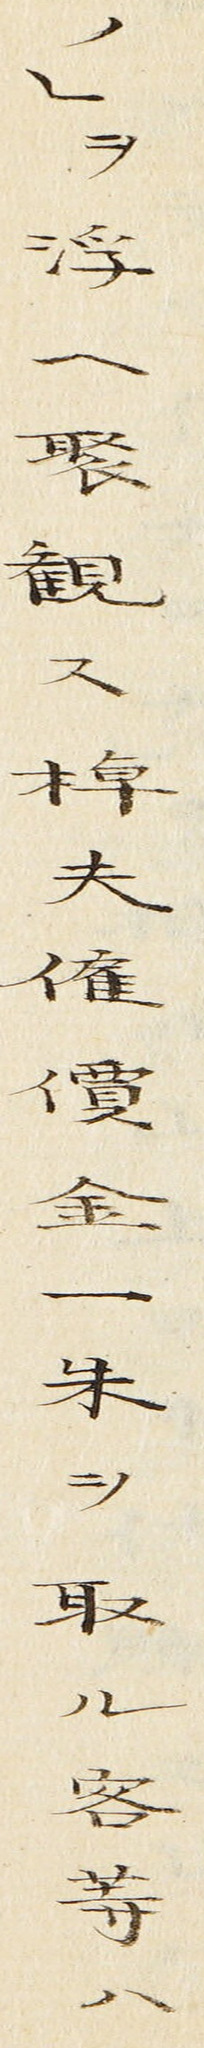ノ」ヲ浮ヘ聚観ス棹夫雇価金一朱ヲ取ル客等ハ
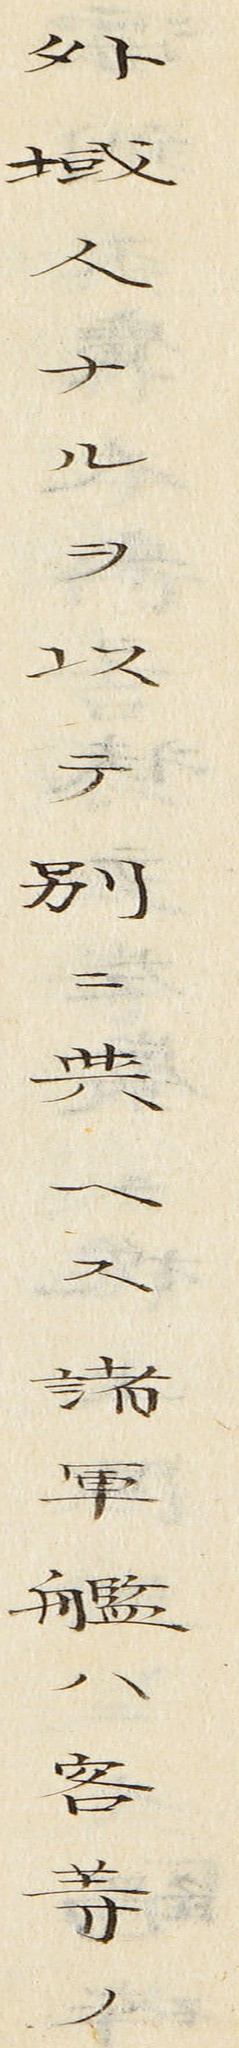外域人ナルヲ以テ別ニ与ヘス諸軍艦ハ客等ノ
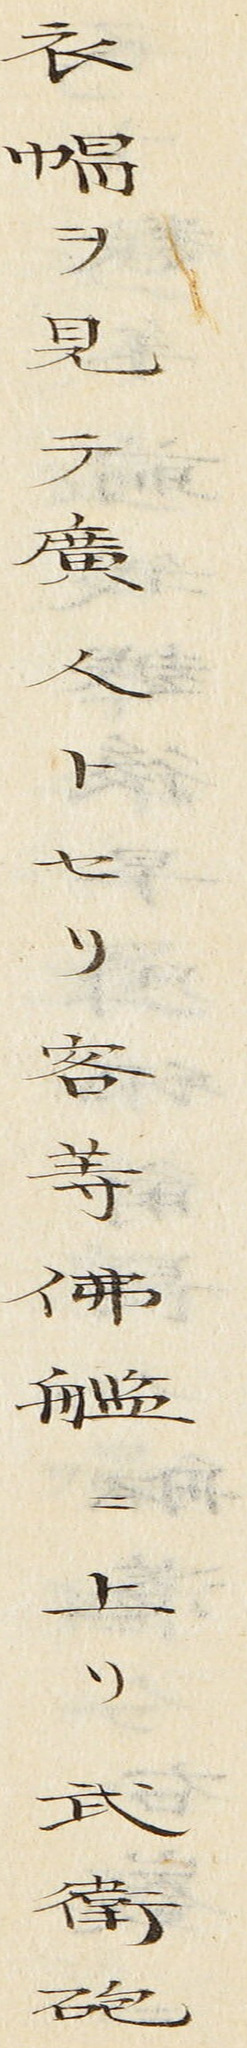衣帽ヲ見テ広人トセリ客等仏艦ニ上リ武衛砲
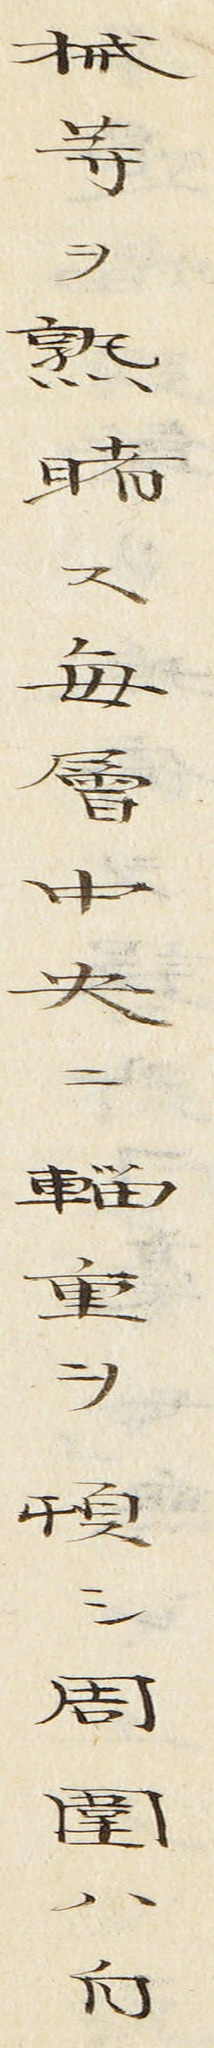械等ヲ熟睹ス毎層中央ニ輜重ヲ頓シ周囲ハ自
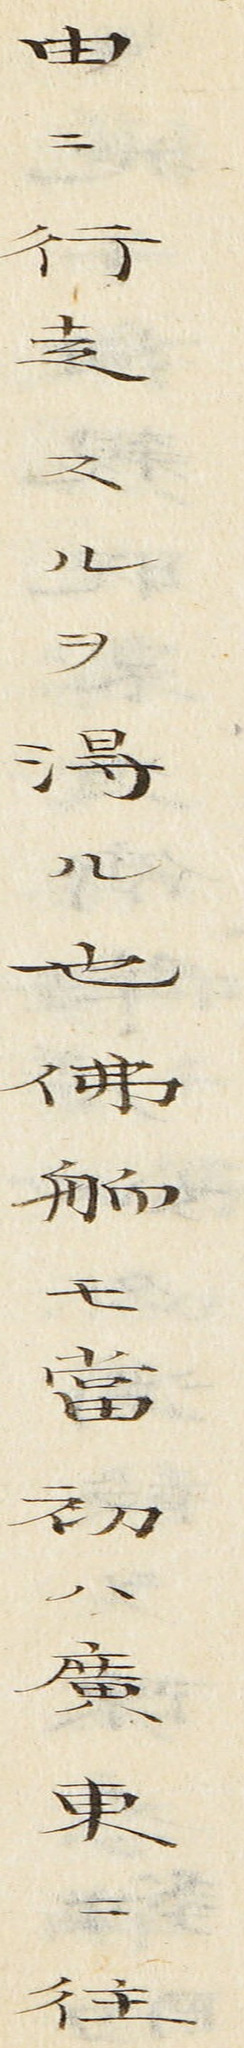由ニ行走スルヲ得ル也仏舶モ当初ハ広東ニ往
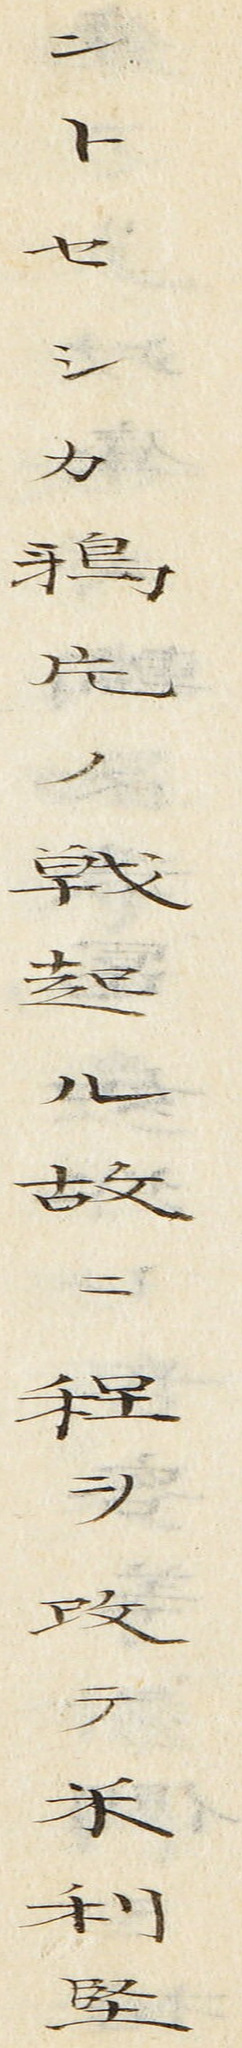ントセシカ鴉片ノ戦起ル故ニ程ヲ改テ米利堅
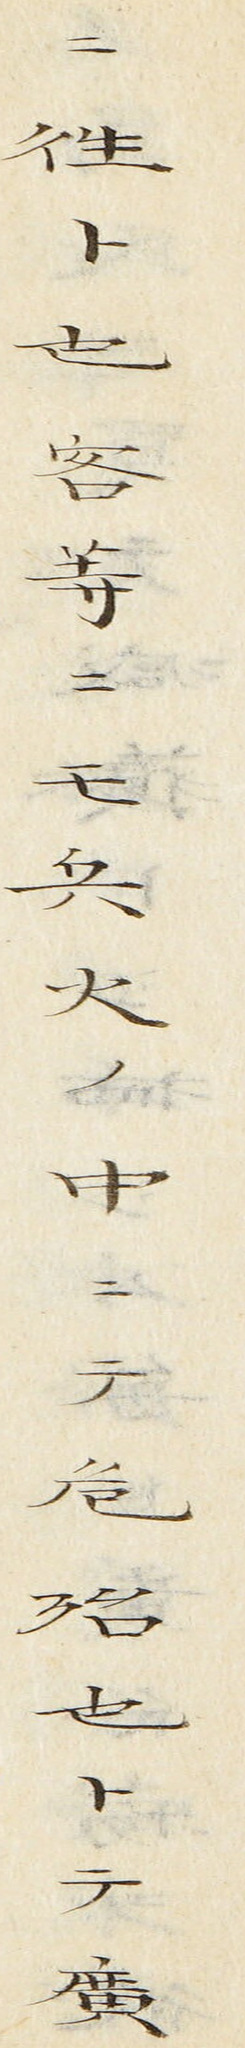ニ往ト也客等ニモ兵火ノ中ニテ危殆也トテ広
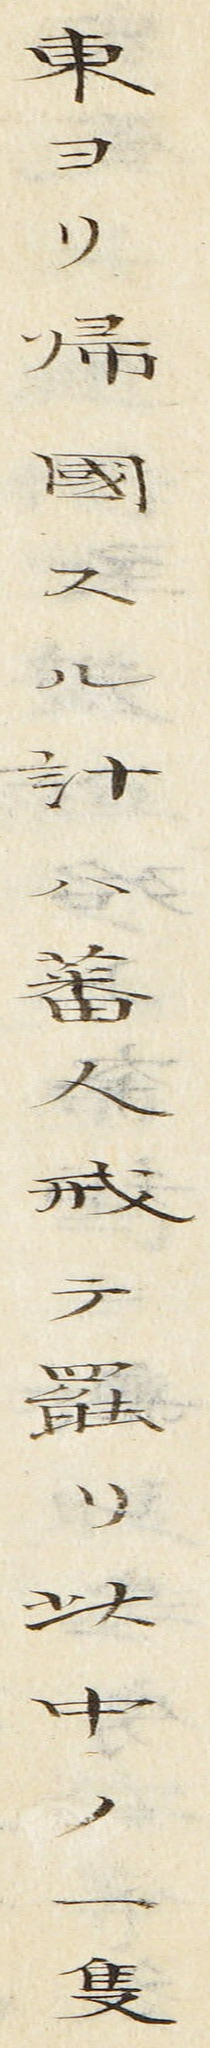東ヨリ帰国スル計ハ蕃人戒テ罷リ此中ノ一隻
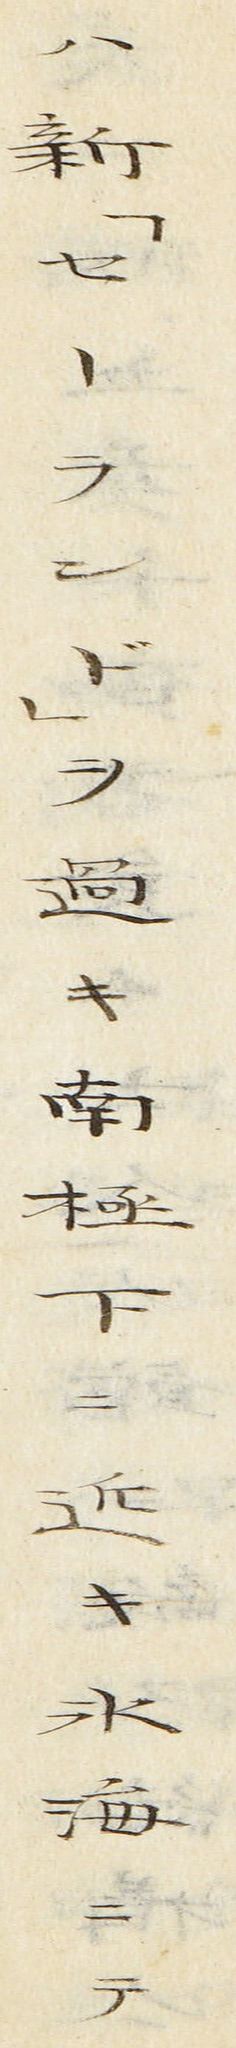ハ新「セーランド」ヲ過キ南極下ニ近キ氷海ニテ
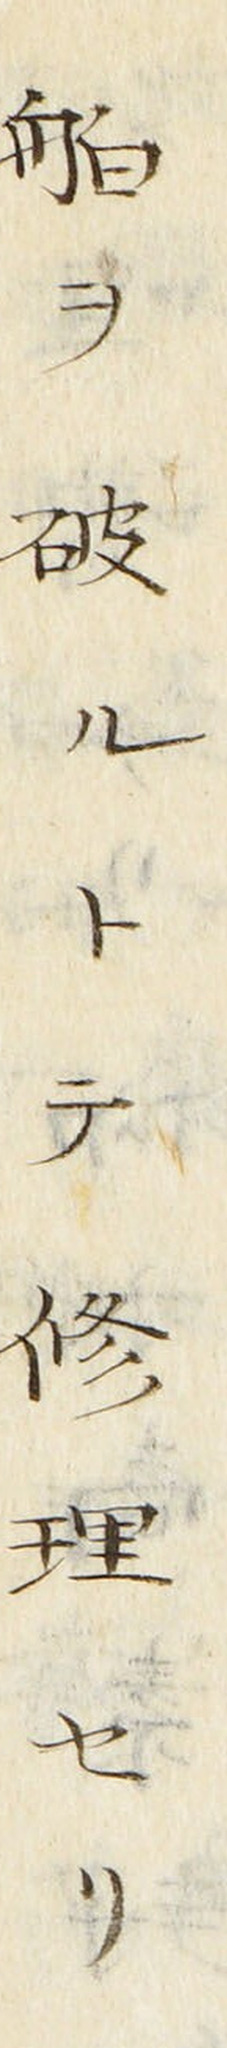舶ヲ破ルトテ修理セリ
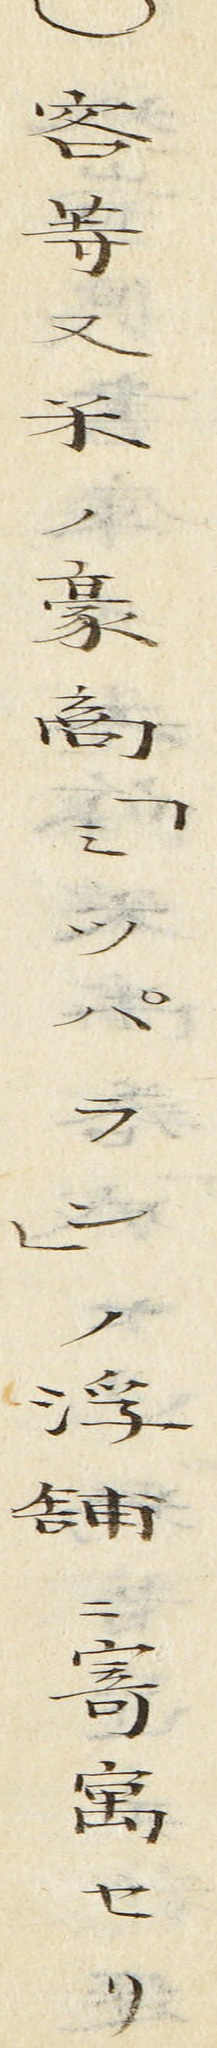○客等又米ノ豪商「ミツパラン」ノ浮舗ニ寄寓セリ

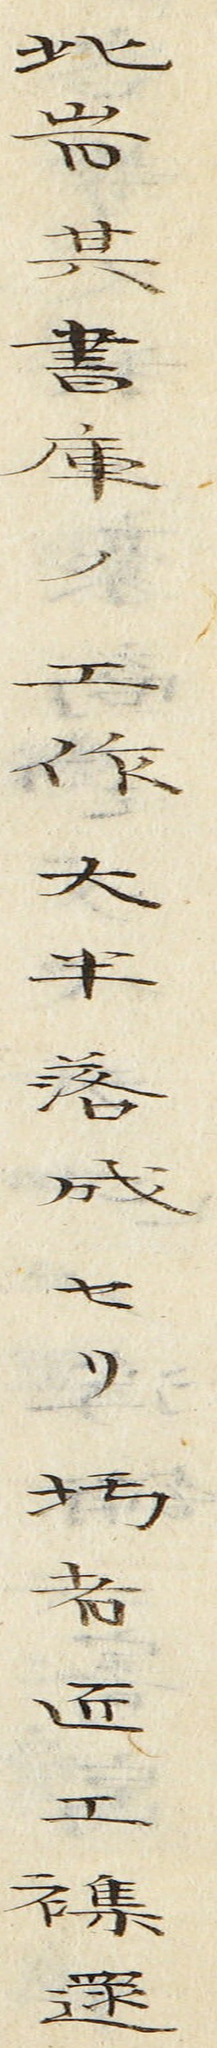此時其書庫ノ工作大半落成セリ圬者匠工雑遝
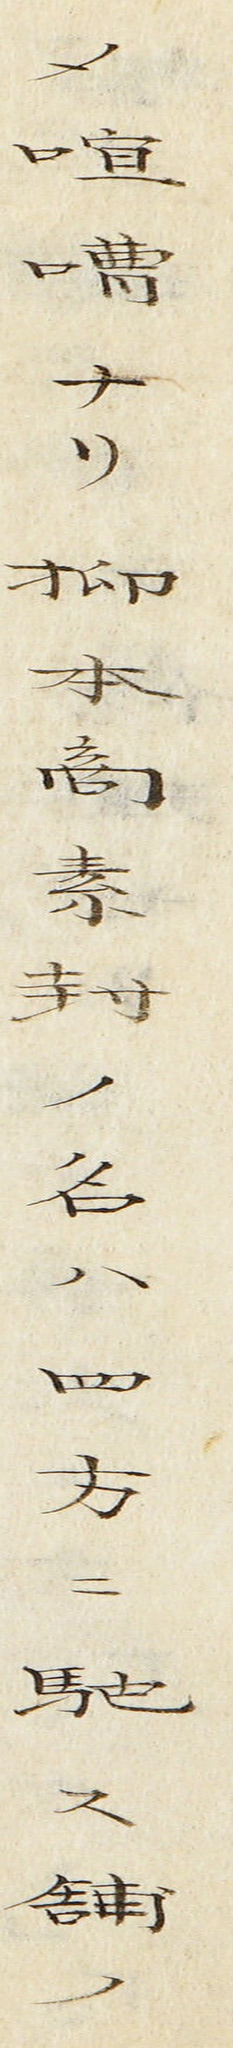シテ喧嘈ナリ抑本抄商素封ノ名ハ四方ニ馳ス舗ノ
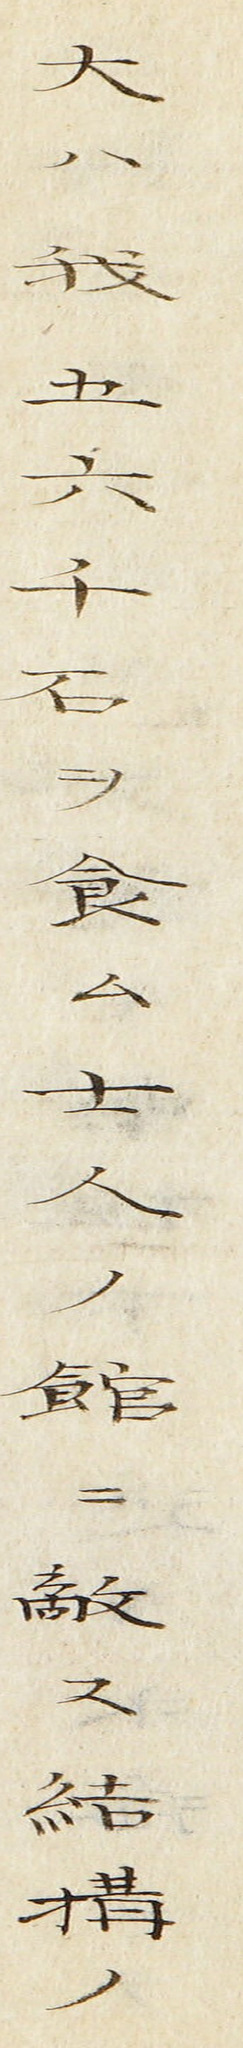大ハ我五六千石ヲ食ム士人ノ館ニ敵ス結搆ノ
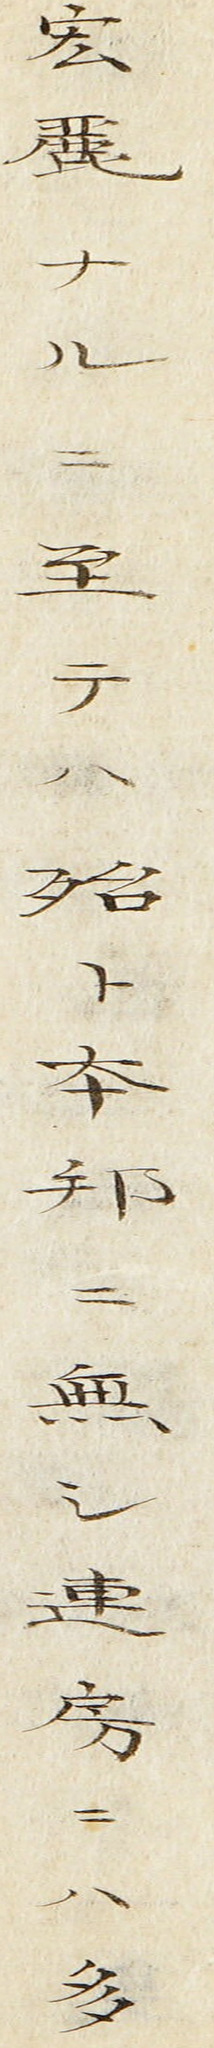宏麗ナルニ至テハ殆ト本邦ニ無シ連房ニハ多
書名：蕃談
